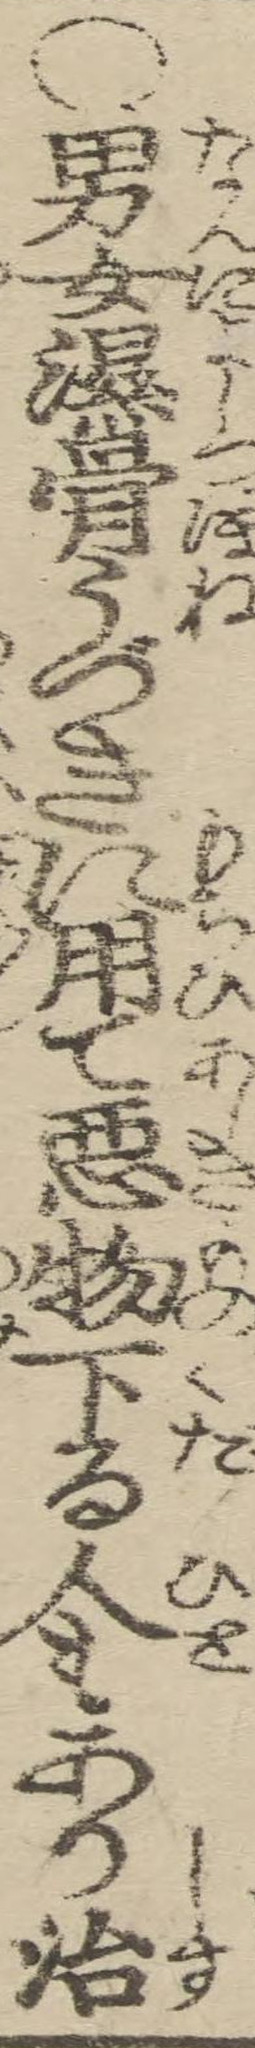○男女湿骨うづきに用て悪物下る人もあり治
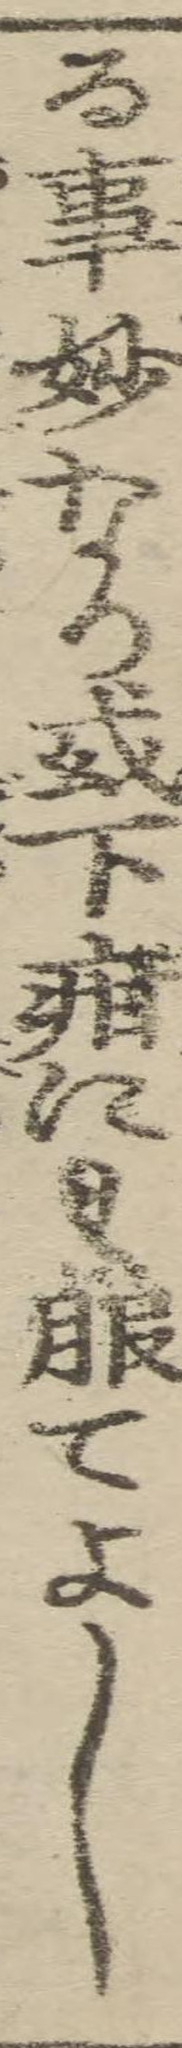る事妙なり或下疳にも服てよし
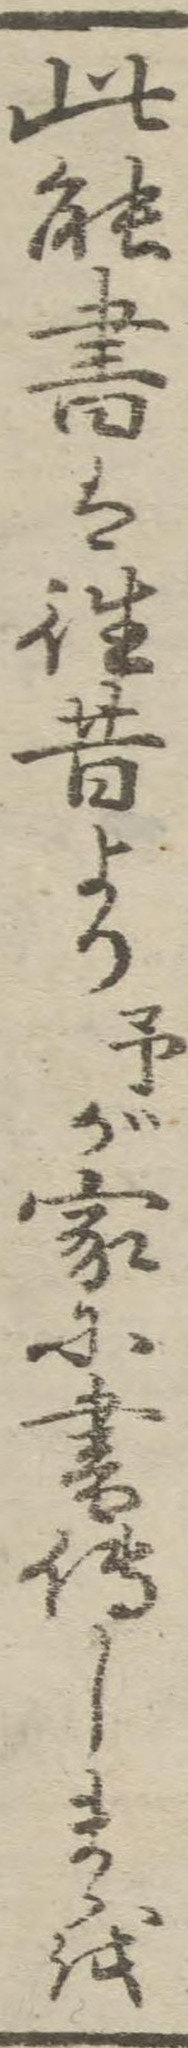此能書は往昔より予が家に書伝しまゝを
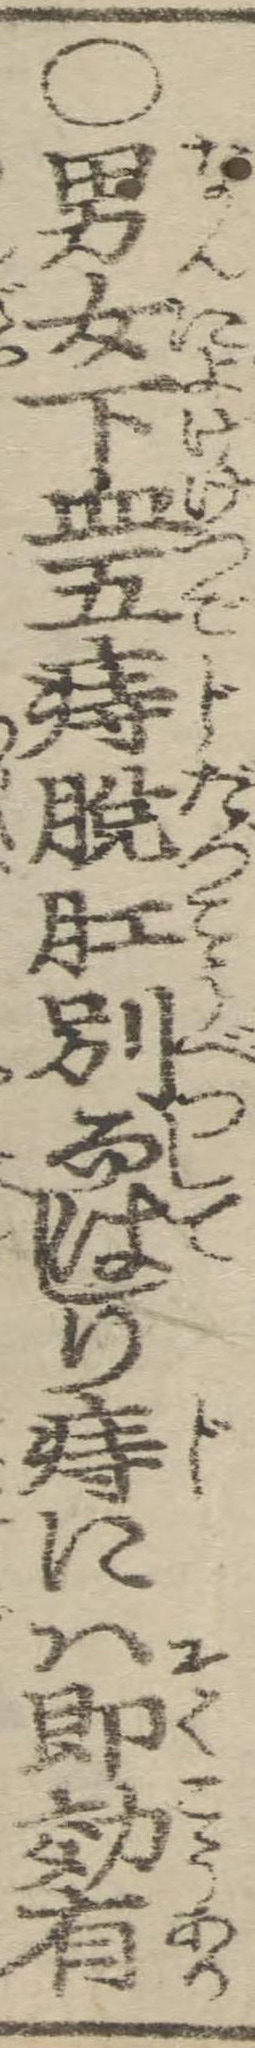○男女下血五痔脱肛別而はしり痔には即効有
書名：浪華薬種問屋能書張交帖. 二
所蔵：国立国会図書館 National Diet Library, JAPAN
